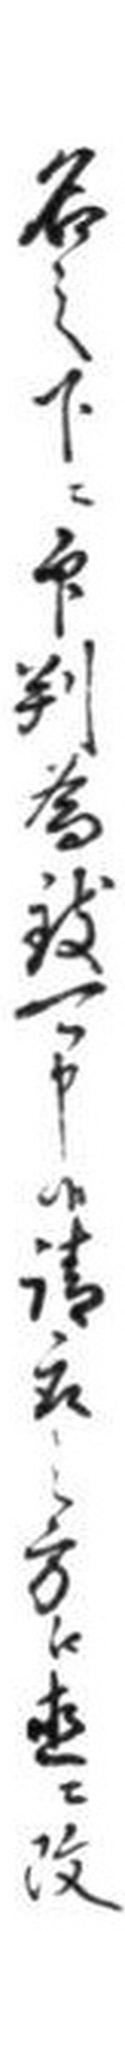名之下ニ印判為致可申候請取之方江直ニ改
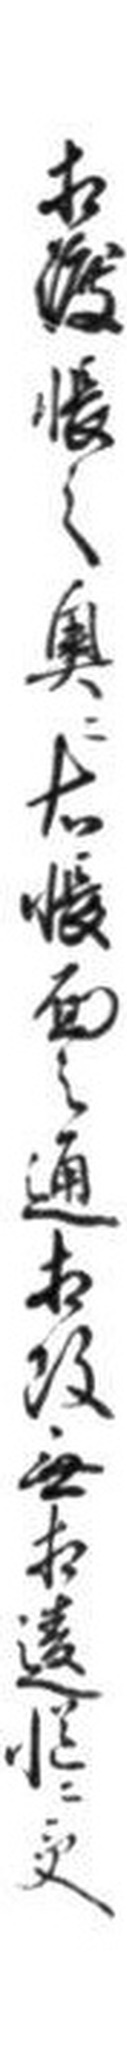相渡帳之奥ニ右帳面之通相改無相違慥ニ受
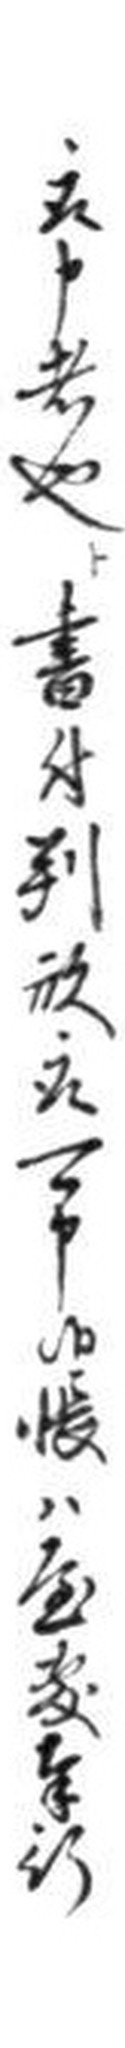取申者也ト書付判形取可申候帳ハ屋敷奉行
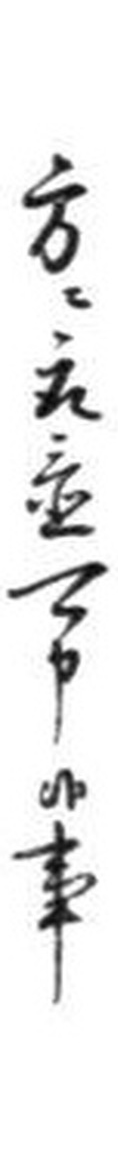方ニ取置可申候事
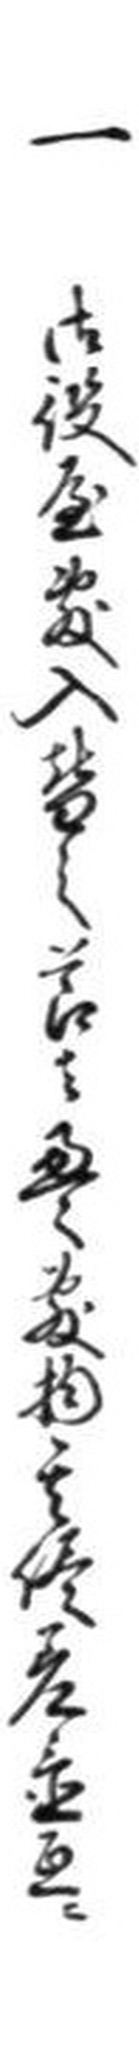一御役屋敷入替之節者畳敷物其儘差置互ニ
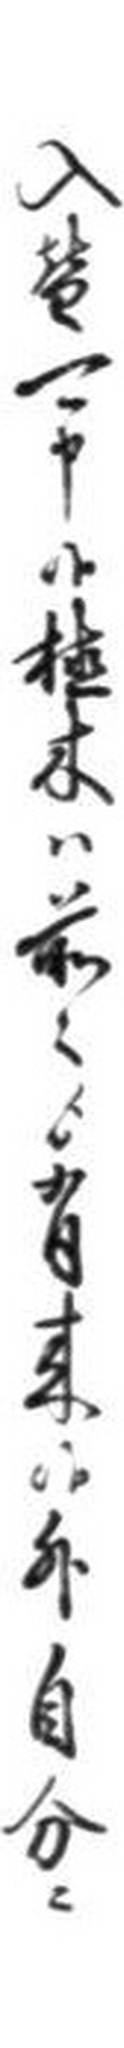入替可申候植木ハ前々ゟ有来候外自分ニ
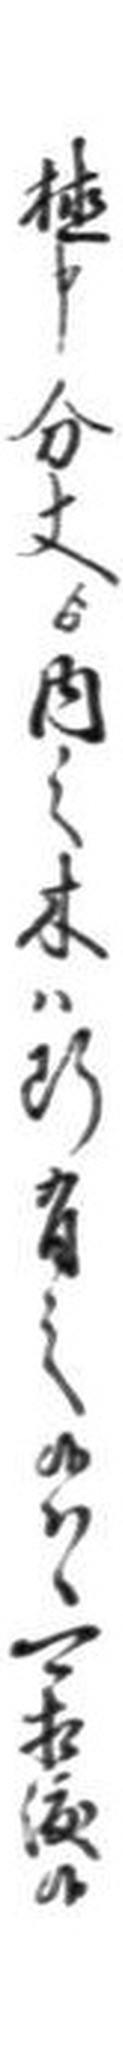植申分丈ゟ内之木ハ断有之候ハヽ可相渡候
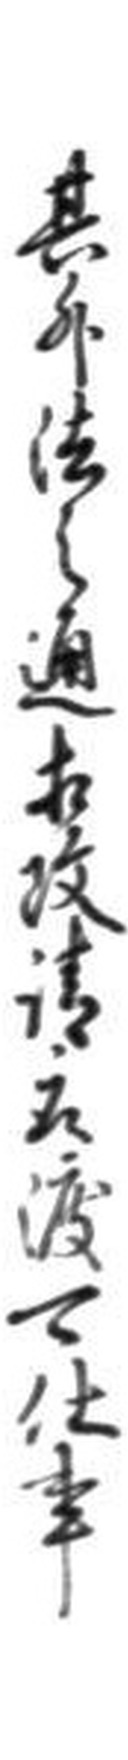其外法之通相改請取渡可仕事
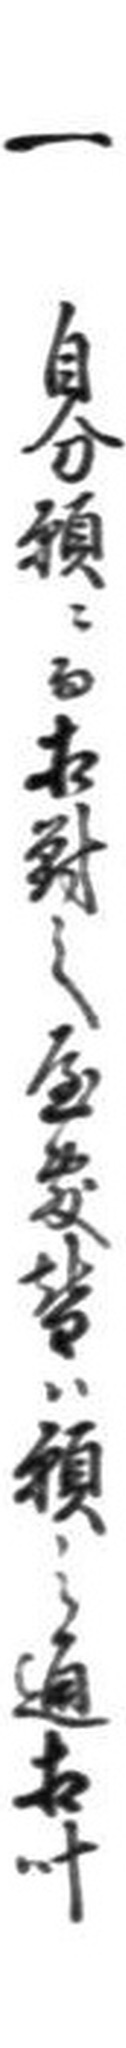一自分願ニ而相対之屋敷替ハ願之通相叶
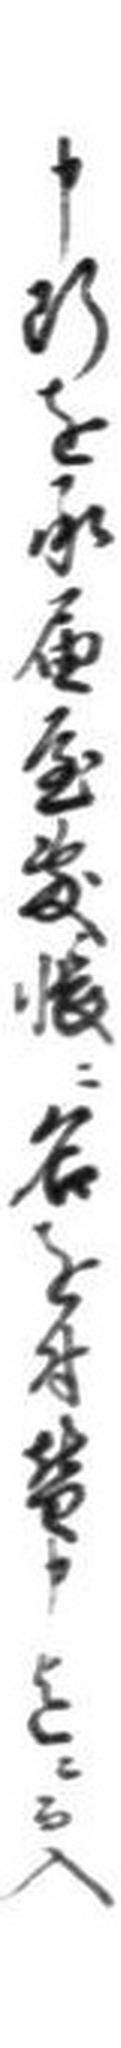申断を承届屋敷帳ニ名を付替申迄ニ而入
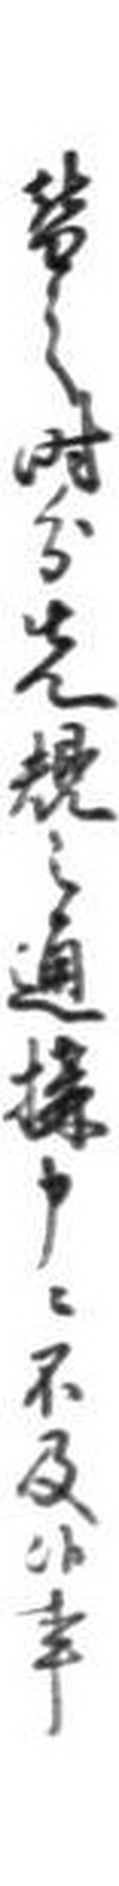替之時分先規之通構申ニ不及候事
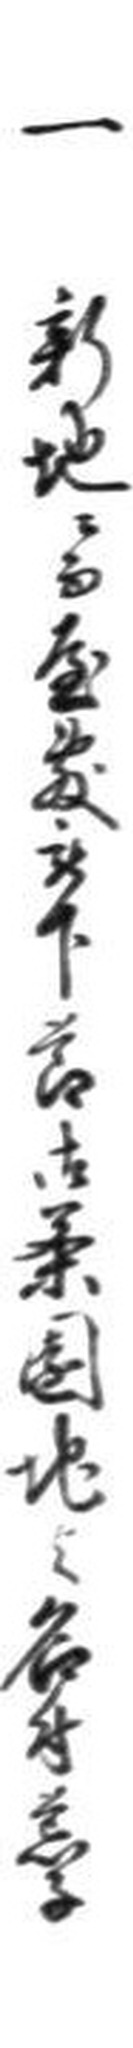一新地ニ而屋敷被下節御茶園地与名付荒子
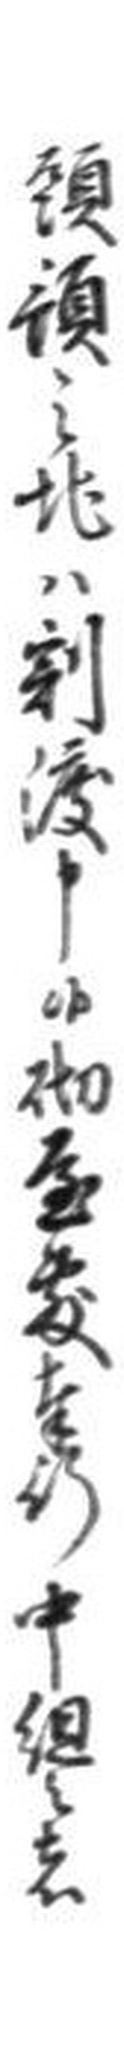頭預之地ハ割渡申候砌屋敷奉行中組之者
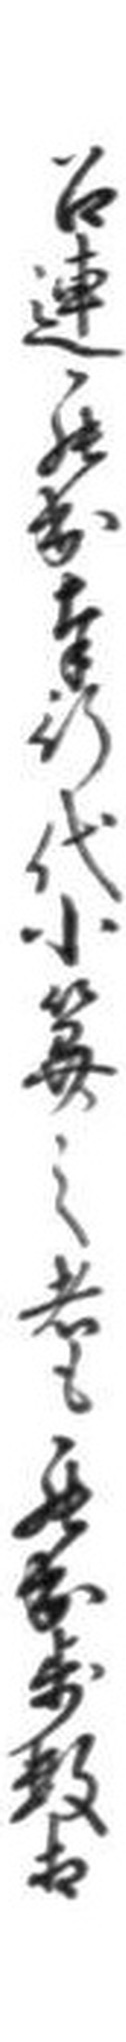召連罷出奉行代小算之者も罷出歩数相
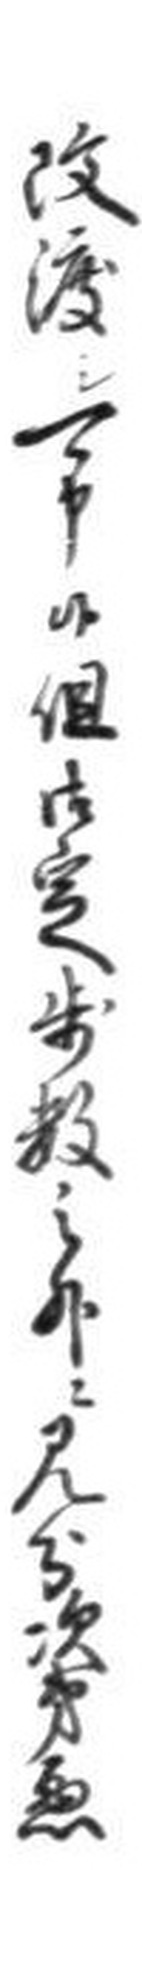改渡シ可申候但御定歩数之外ニ見分次第悪

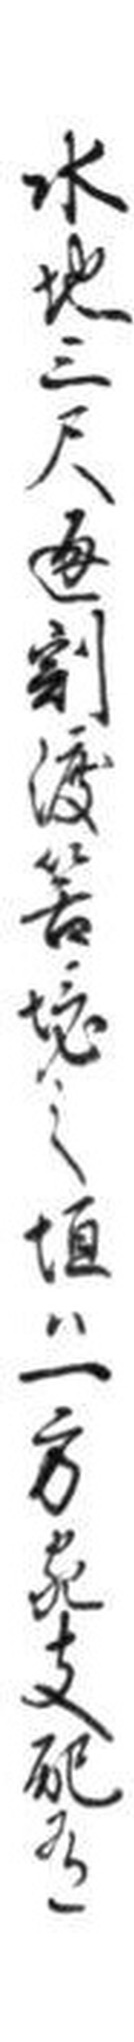水地三尺通割渡筈境之垣ハ一方宛支配有
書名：家譜 三十二 吉邦公 従享保二年到享保三年
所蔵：福井県文書館 Fukui Prefectural Archives
